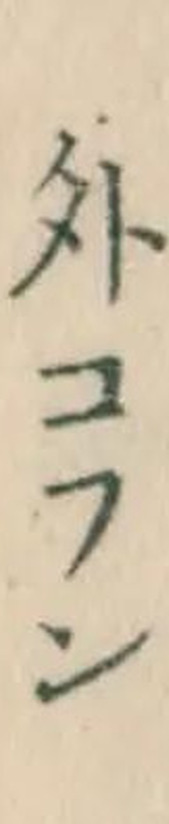外コフン

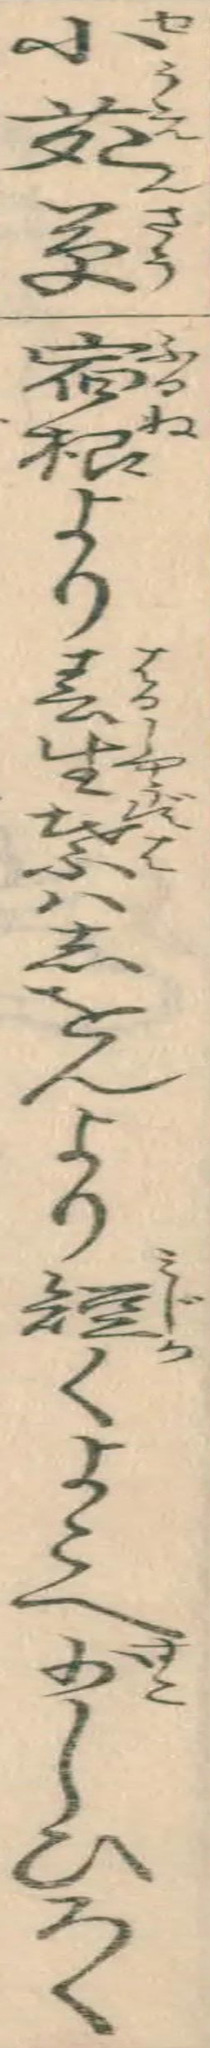[小苑草]宿根より春生葉はしをんより短くよこへ少しひろく
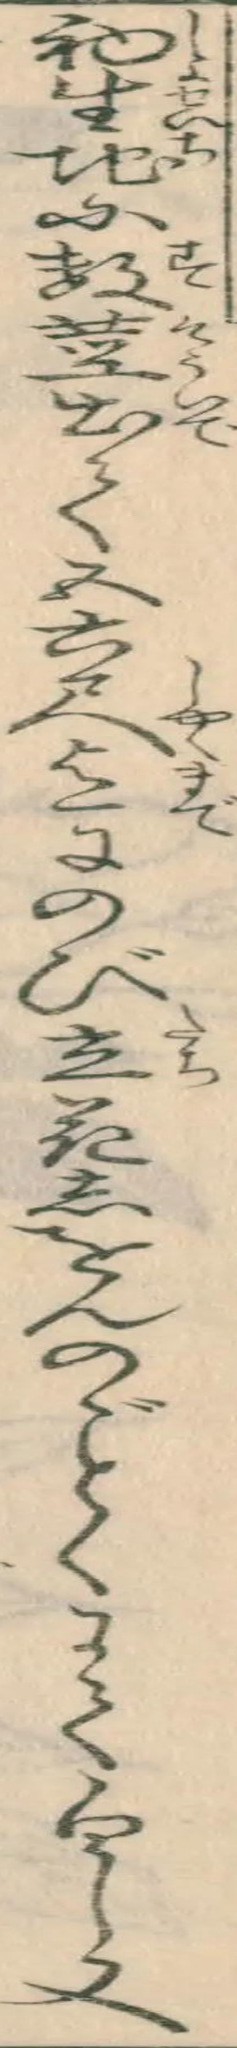初生地に数茎出て五六尺迄にのび立花しをんのごとくにて白し又
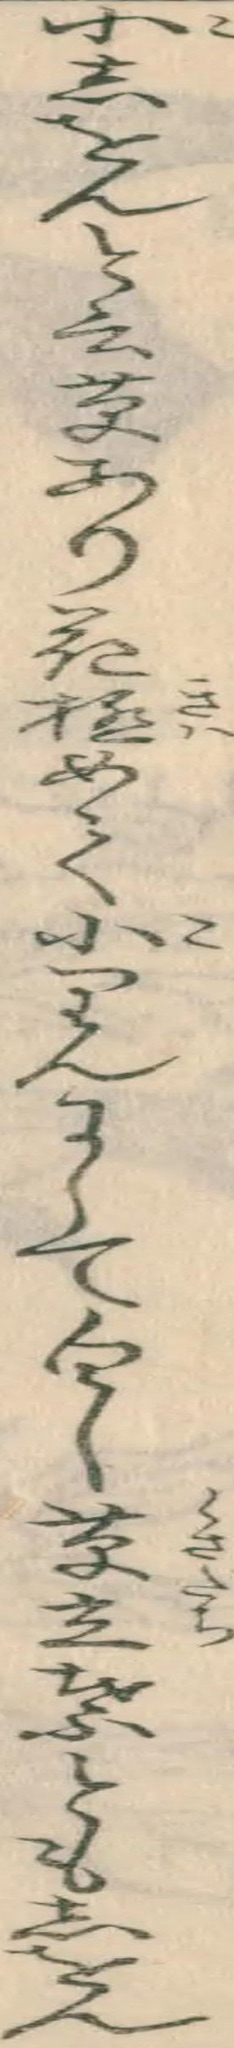小しをんと云草あり花極めて小りんにして白し草立葉ともしをん
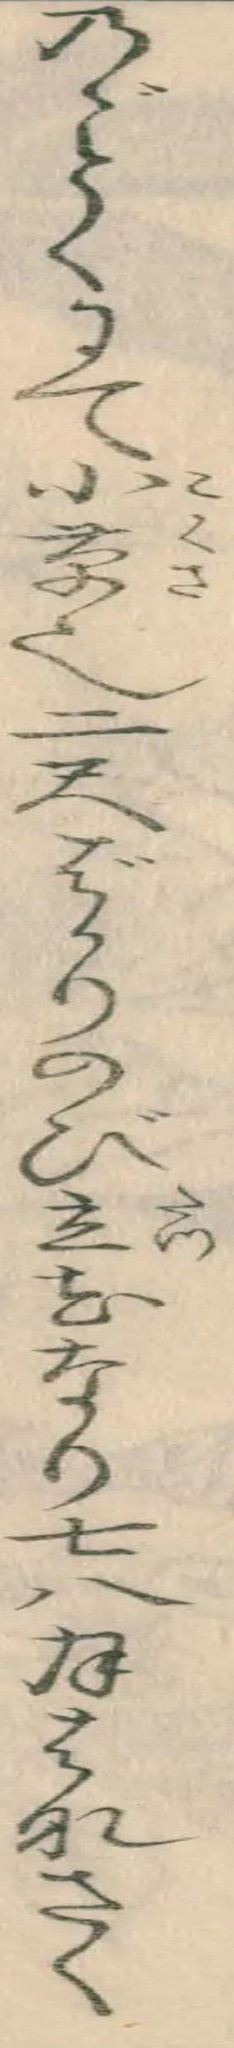のごとくにて小草也二尺ばかりのび立花なり七八月はなさく
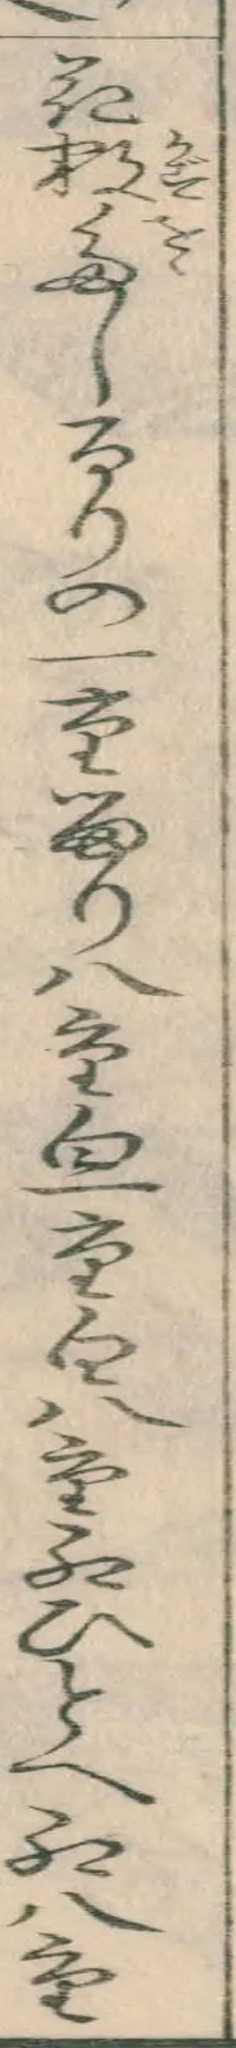花数多しるりの一重るり八重白一重白八重紅ひとへ紅八重
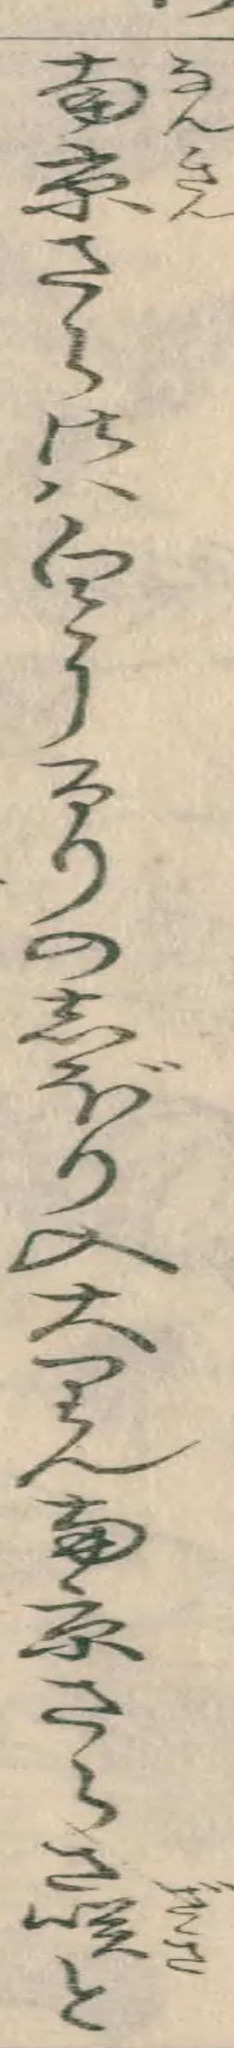南京さらさは白にるりのしぼり入大りん南京さらさ咲と
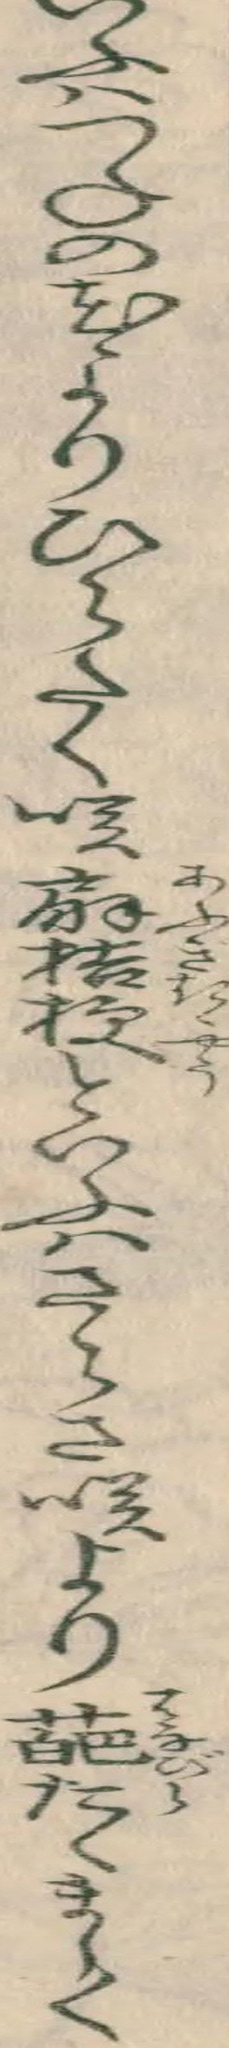いふはつねの花よりひらたく咲扇桔梗といふはさらさ咲より葩たくましく
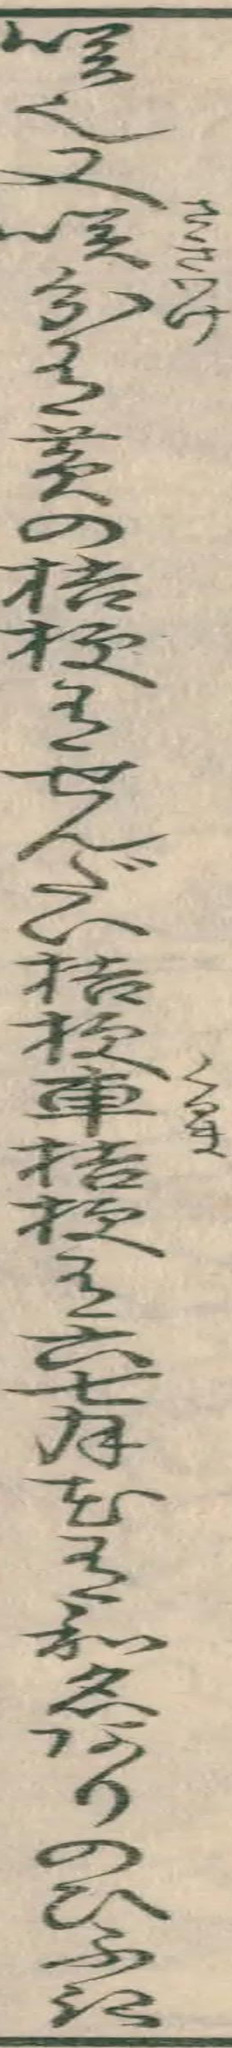咲也又咲分有黄の桔梗有せんだい桔梗車桔梗有六七月花有和名ありのひふき
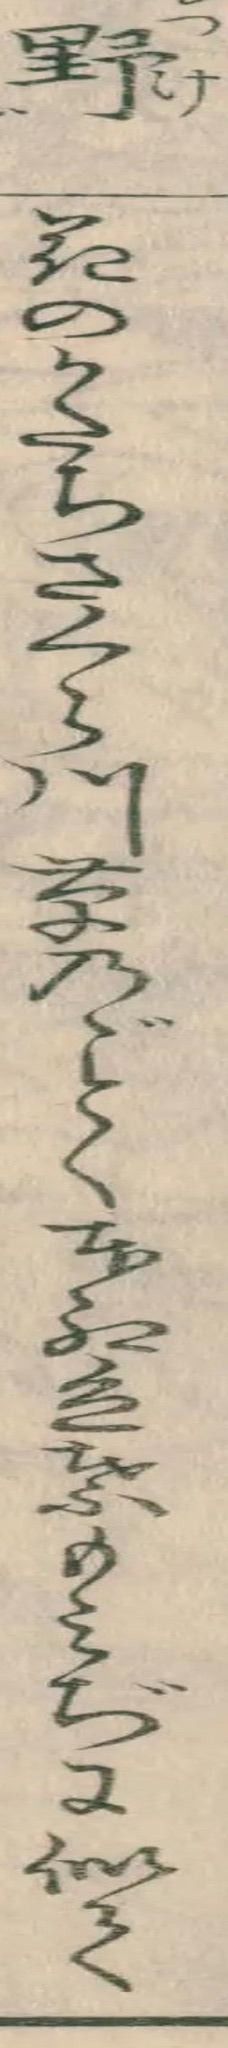花のかたちさくら川草のごとく本紅色葉もみぢに似て
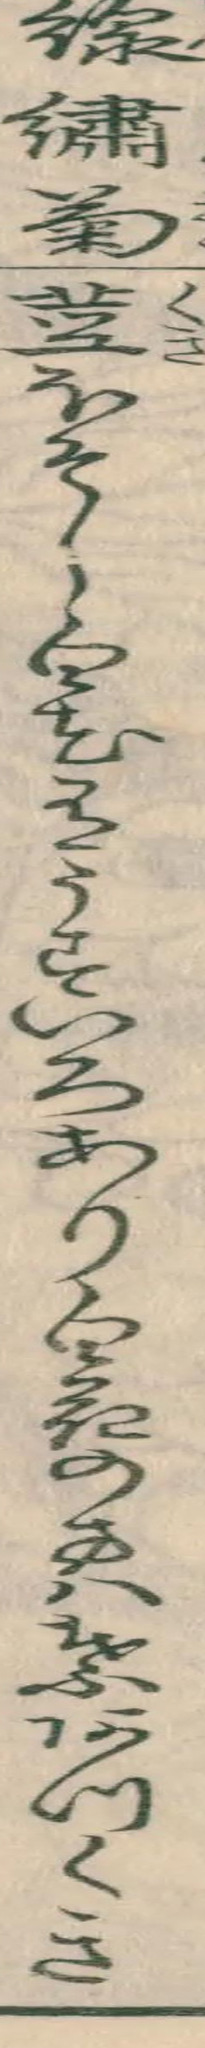茎ほそし白花有うすいろあり白花の方は葉あつくき
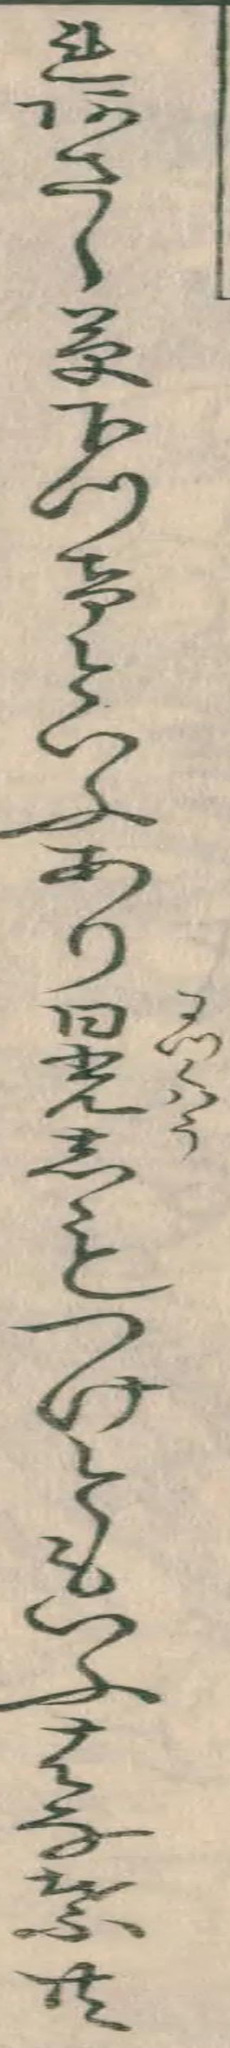れあさし草下つけといふあり日光しもつけともいふはな葉共
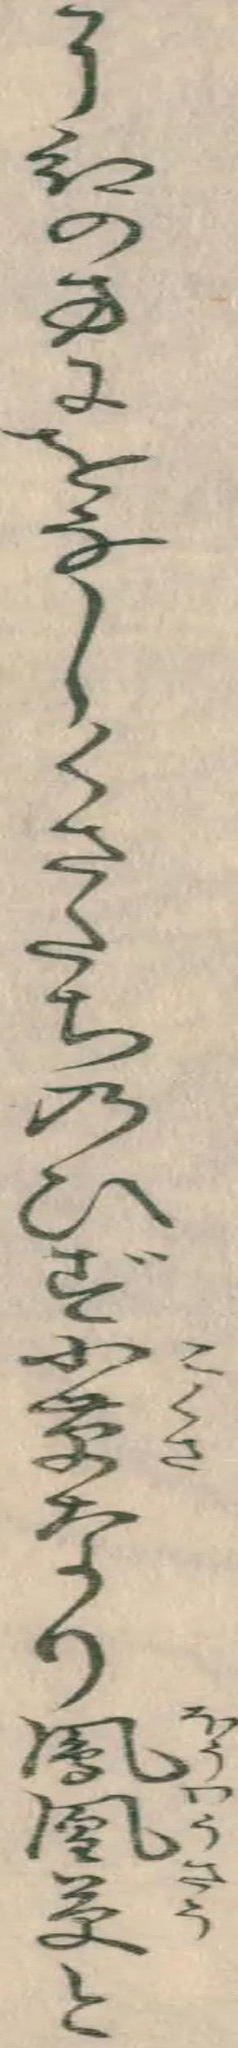に紅の方にをなしくさたちのひず小草なり鳳凰草と
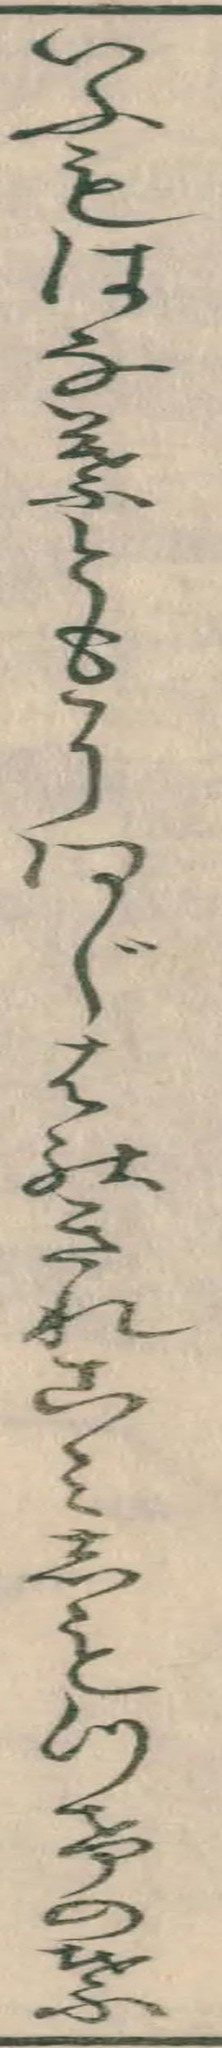いふもはな葉ともに同じはのきれこみしもつけの葉
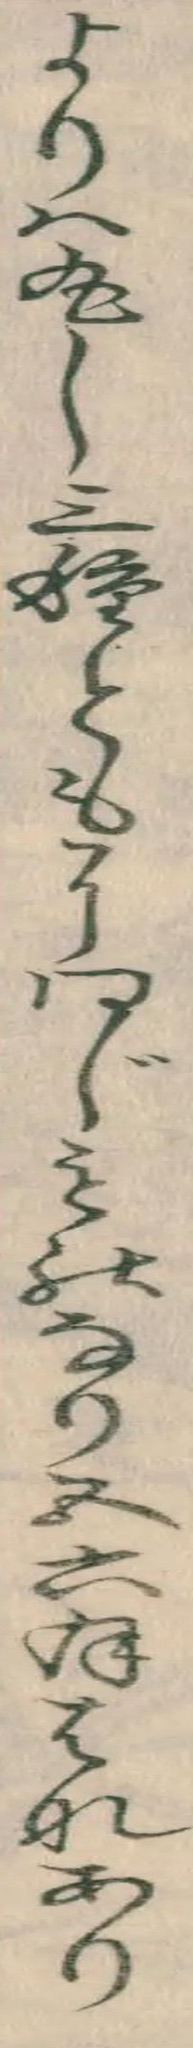よりは丸し三種ともに同じものなり五六月はなあり
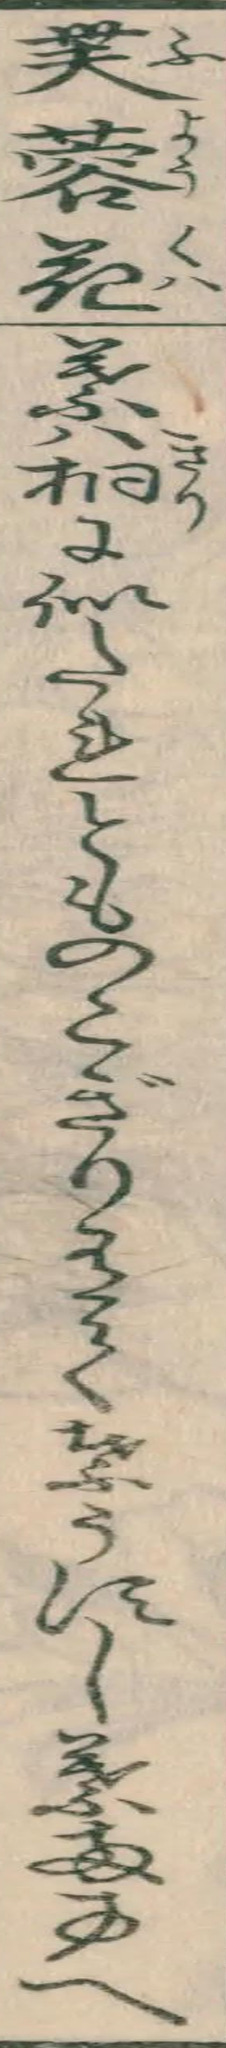[芙蓉花]葉は桐に似たれとものこぎり有て葉うすし葉両方へ
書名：畫本野山草. [1]
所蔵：国立国会図書館 National Diet Library, JAPAN
